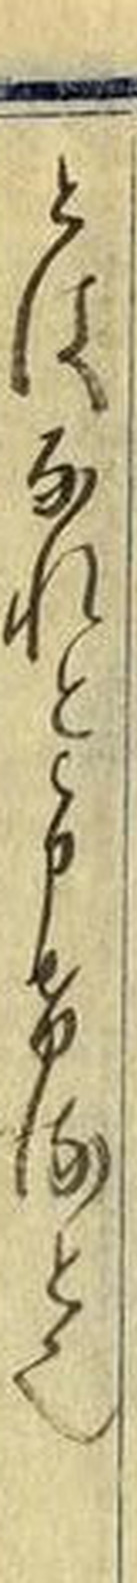とはなれと被申けると也

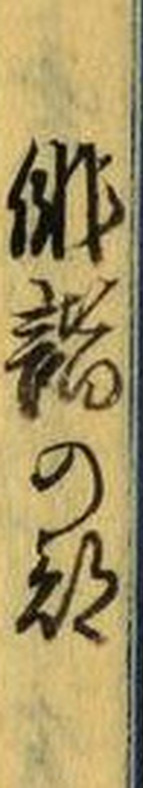俳諧の部
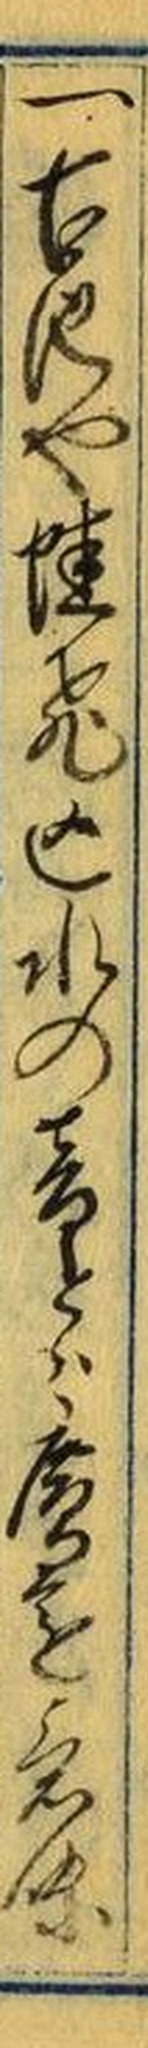一古池や蛙飛込水の音とは広遠意味
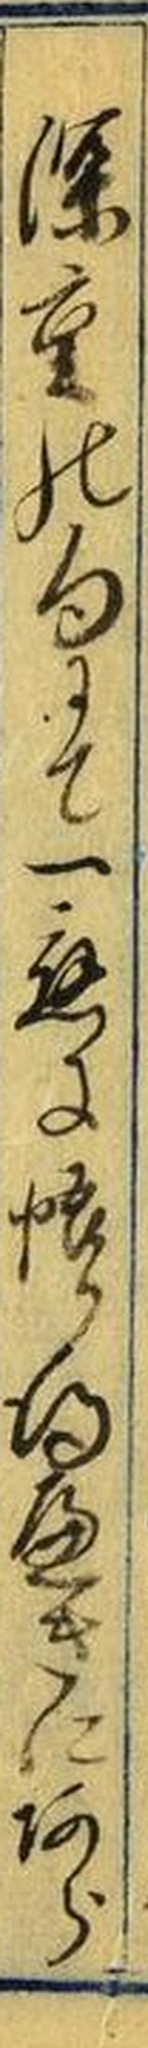深重の句にて一応に悟り得へきにあら
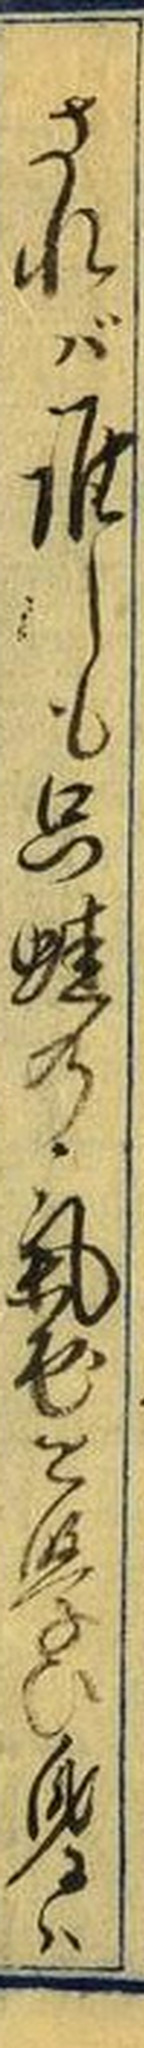されば誰しも只蛙の気色を学ひ身には
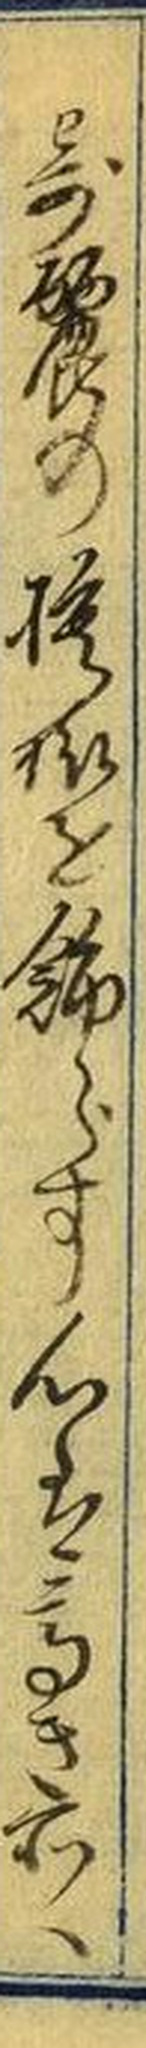奇麗の模様を飾らす心は高き所へ
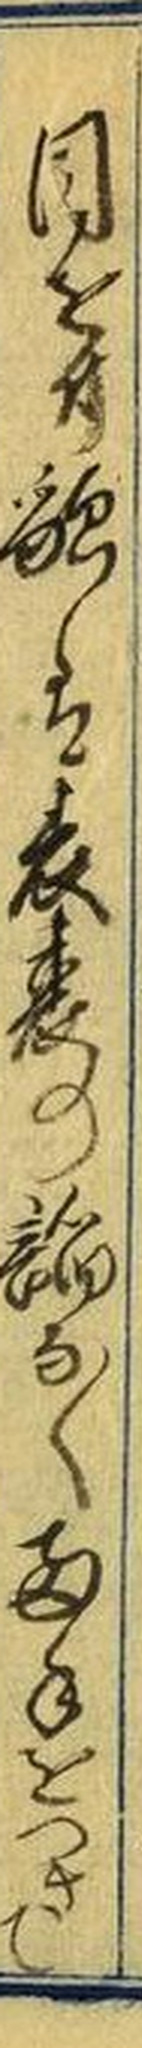目を付貌は表裏の諂なく両手をつきて
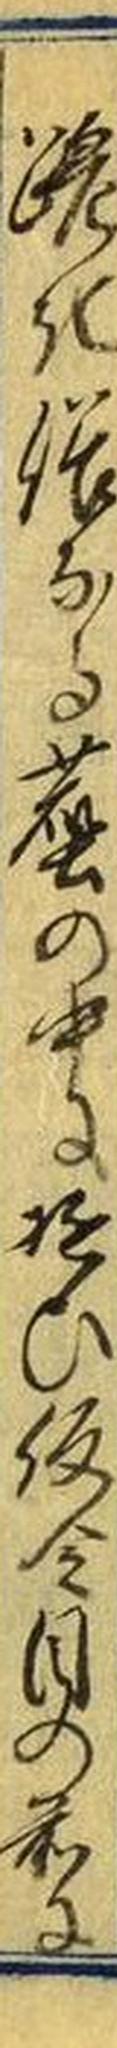跪き俗なる塵の中に遊ひ仮令目の前に
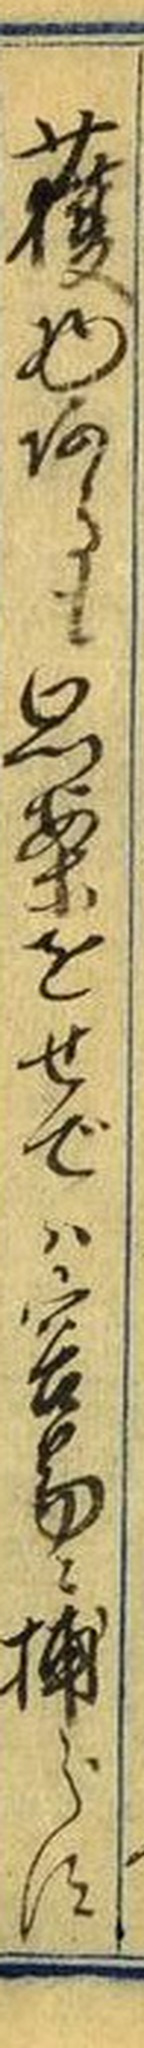獲物あるも思案をせでは容易に捕らす
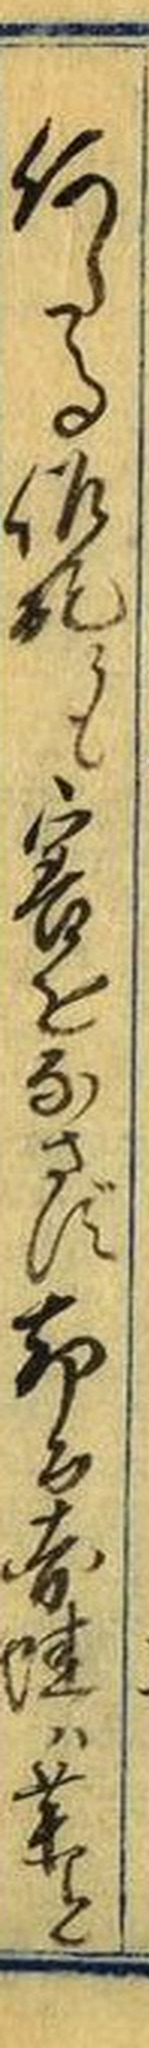何たる作配にも害をなさず却而赤蛙は薬と
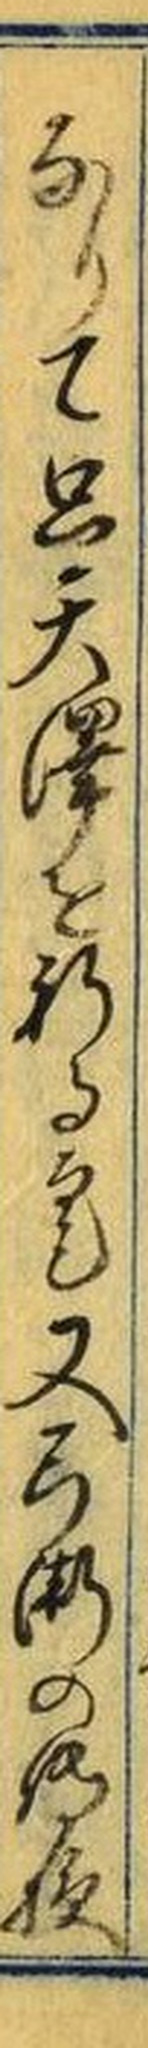なりて只天沢を祈る而已又弓術の伝様

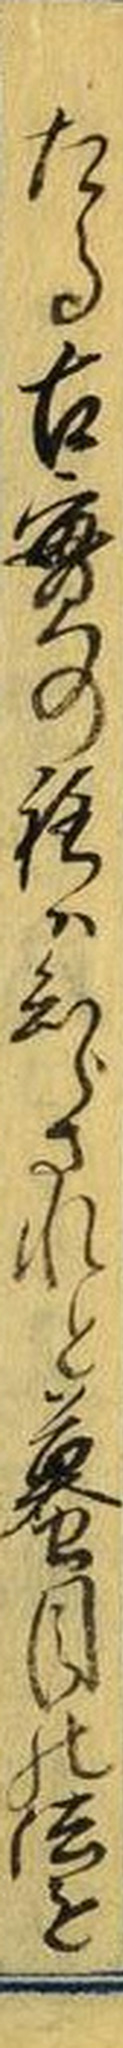たる古実の程は知らされと蟇目の法を
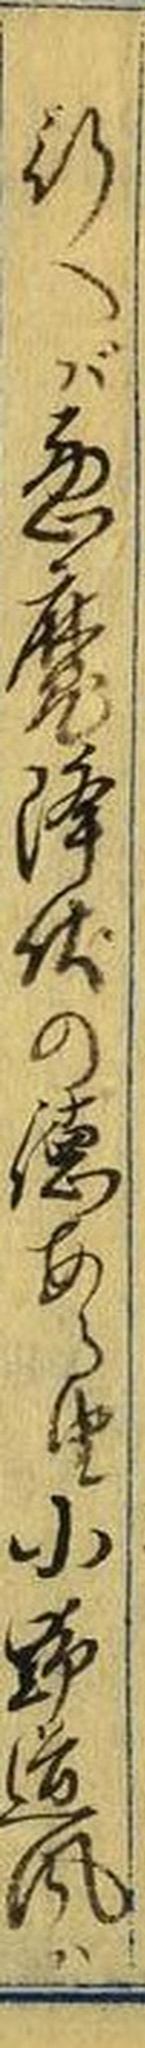行へば悪魔降伏の徳ある由小野道風は
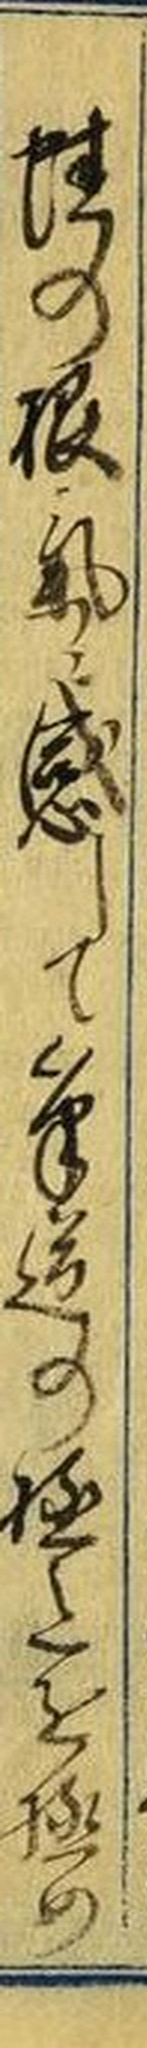蛙の根気に感して筆道の極意を極め
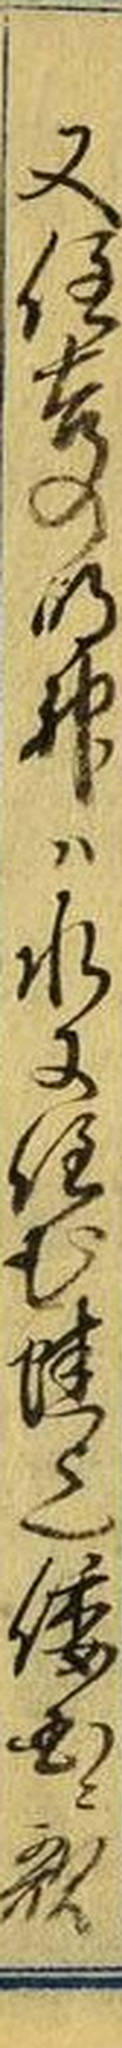又住吉の明神は水に住む蛙迄倭国に歌
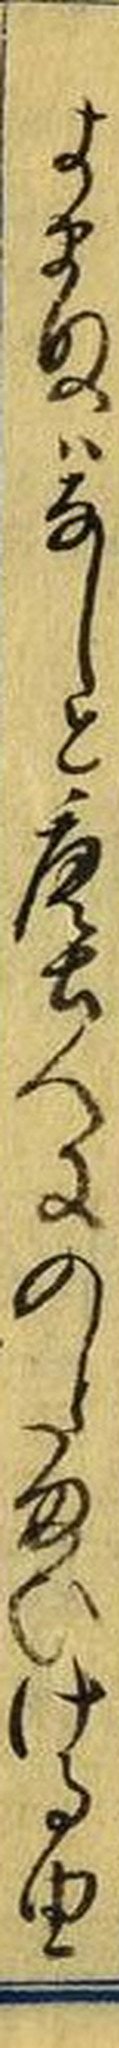よまぬはなしと唐土人にのたまひける由
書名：温古集 三巻
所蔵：福井県文書館 Fukui Prefectural Archives
